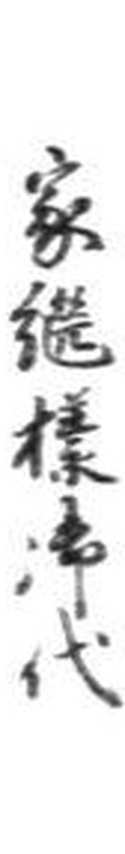家継様御代
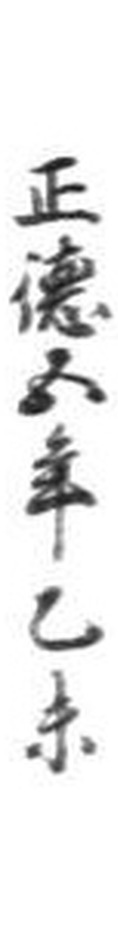正徳五年乙未

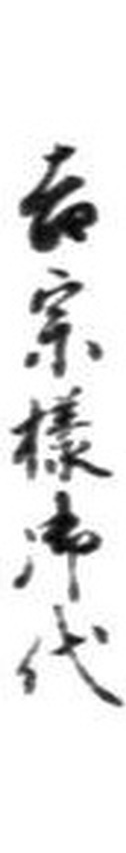吉宗様御代
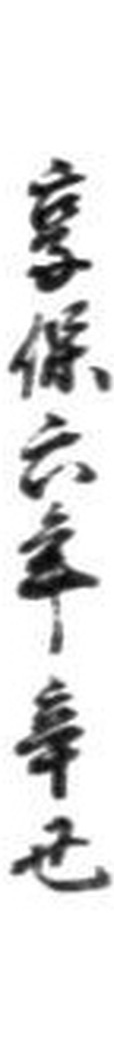享保六年辛丑
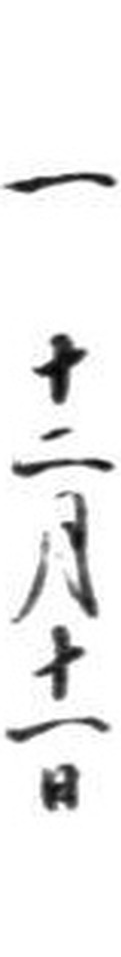一、十二月十一日
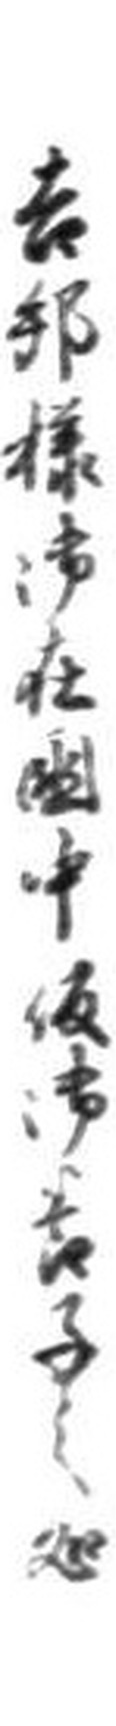吉邦様御在国中仮御養子之処
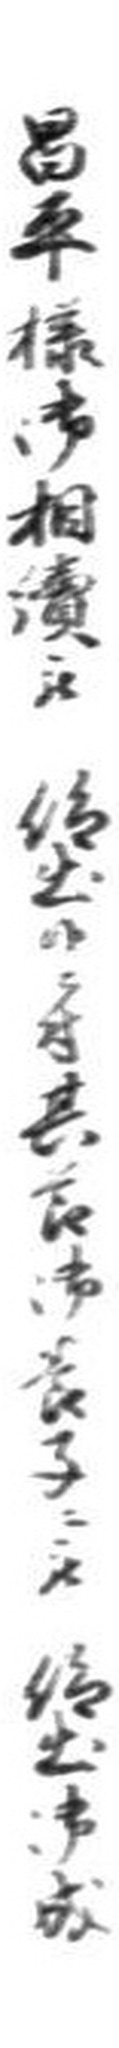昌平様御相続被仰出候ニ付其節御養子ニ被仰出御成
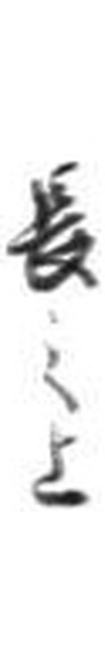長之上
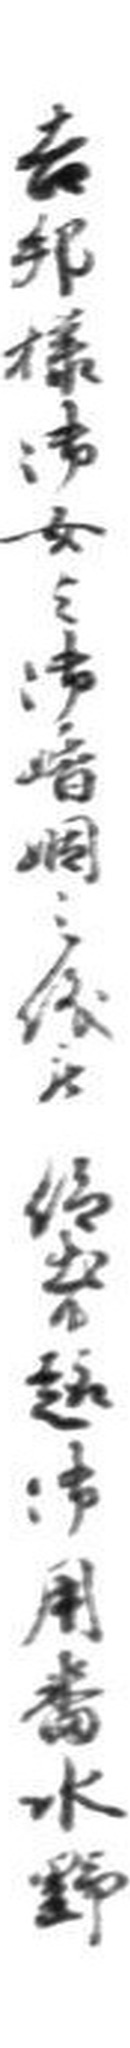吉邦様御女之御婚姻之儀被仰出候趣御用番水野
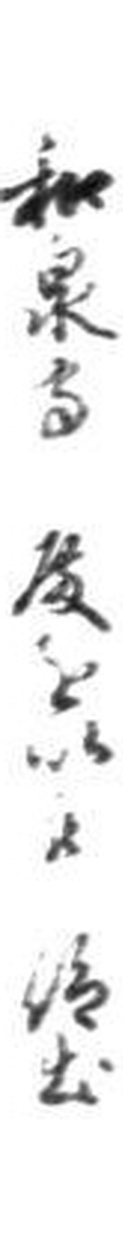和泉守殿を以被仰出

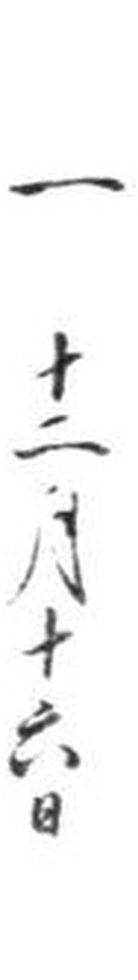一十二月十六日
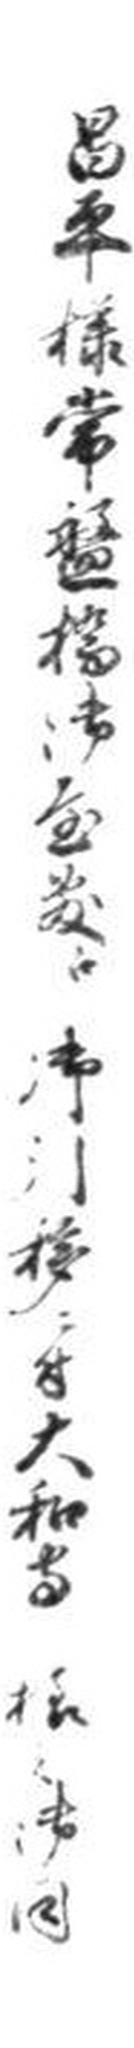昌平様常盤橋御屋敷江御引移ニ付大和守様之御同
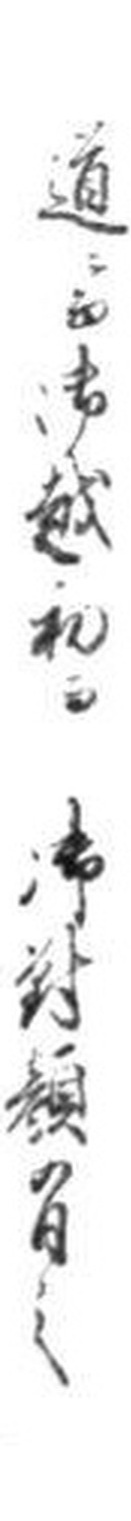道ニ而御越初而御対顔有之
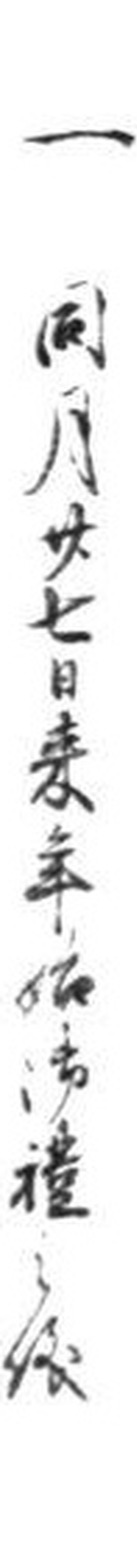一同月廿七日来年始御礼之儀
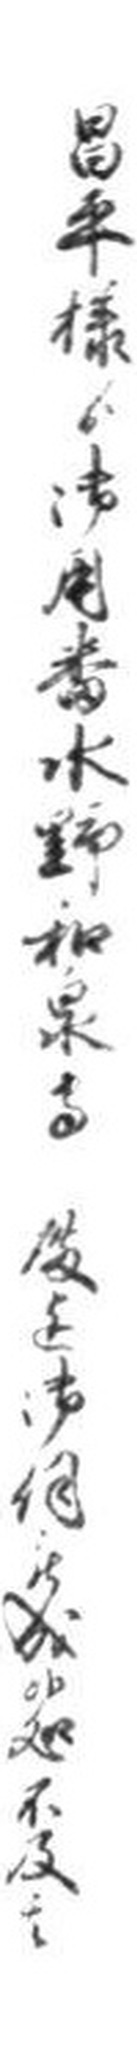昌平様ゟ御用番水野和泉守殿迄御伺被成候処不及其
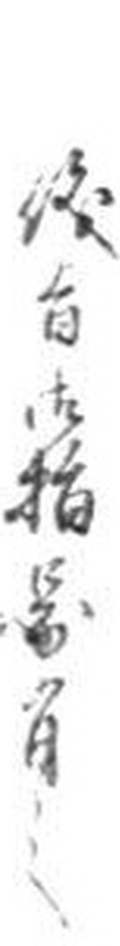儀旨御指図有之
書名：家譜 三十七 宗矩公 従正徳五年到享保九年五月
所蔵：福井県文書館 Fukui Prefectural Archives
